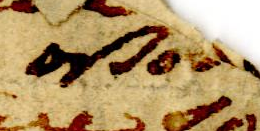also
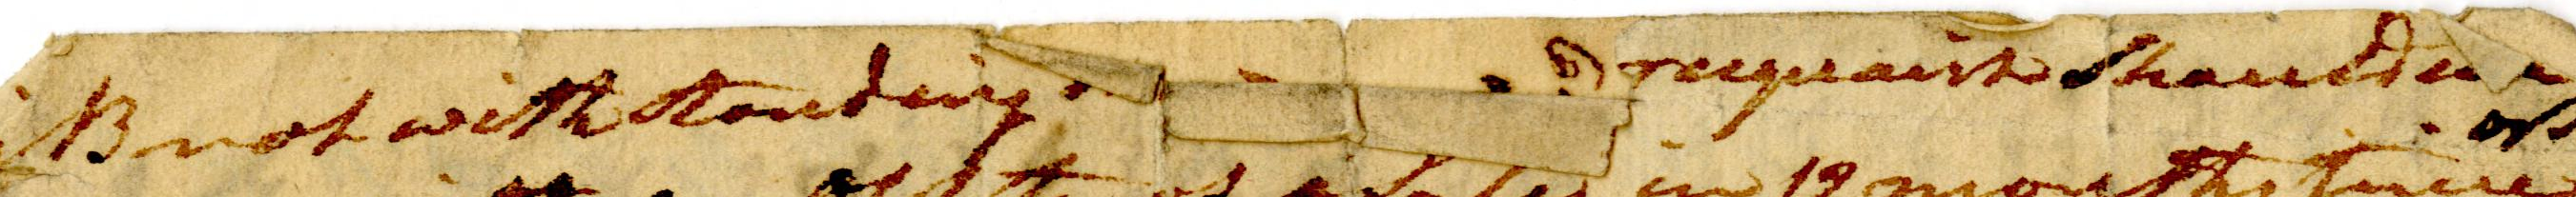Brot with standing [________] request should [___]
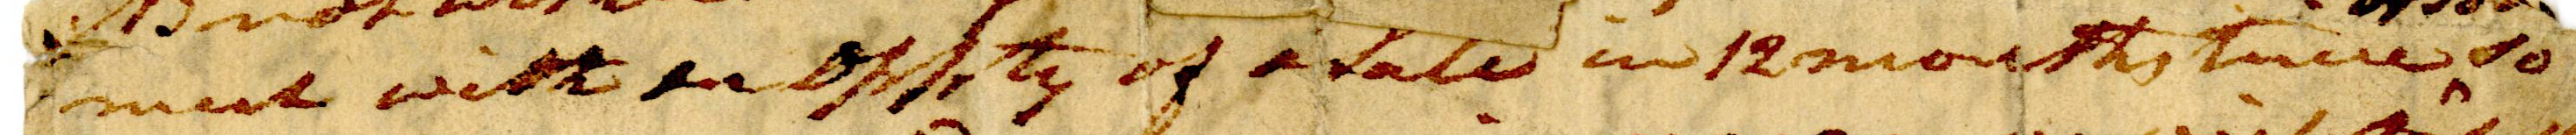meet with an opp^ty of a sale in 12 months time so
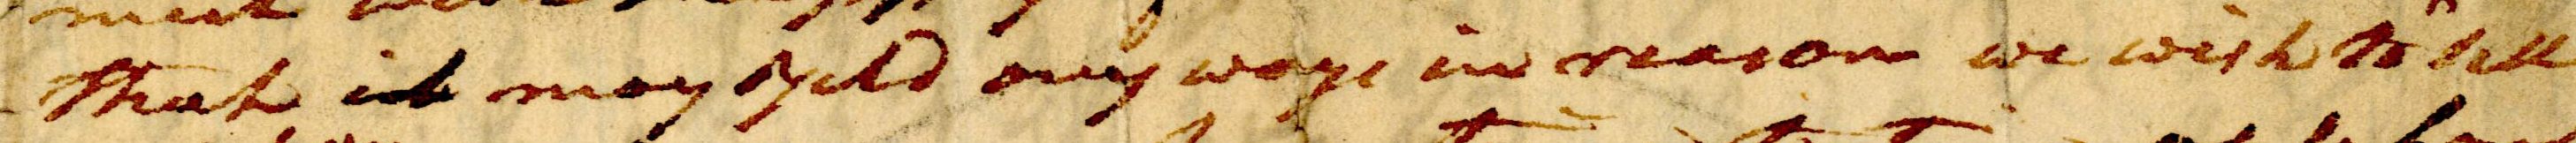that it may yeld any ways in reason we wish to ^ sell
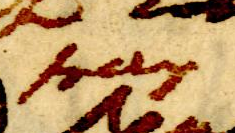pay
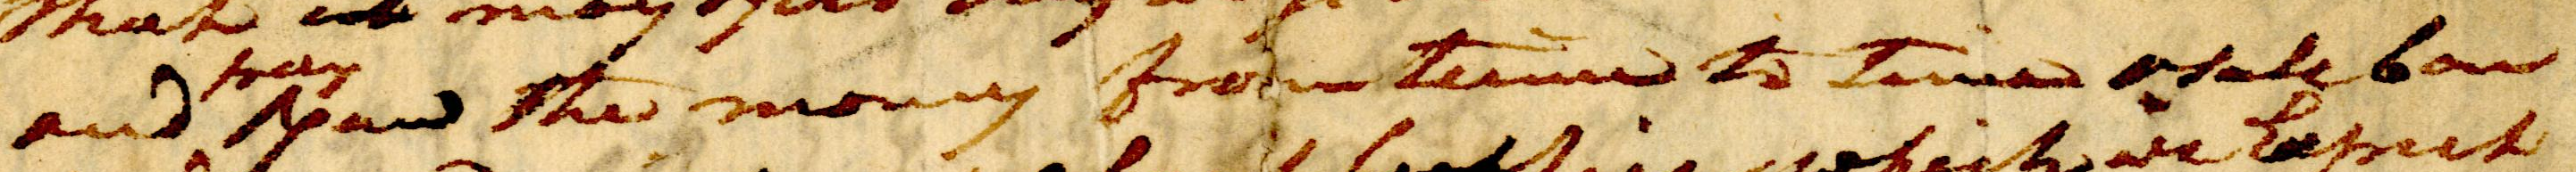and ^ you the money from time to time a sale can
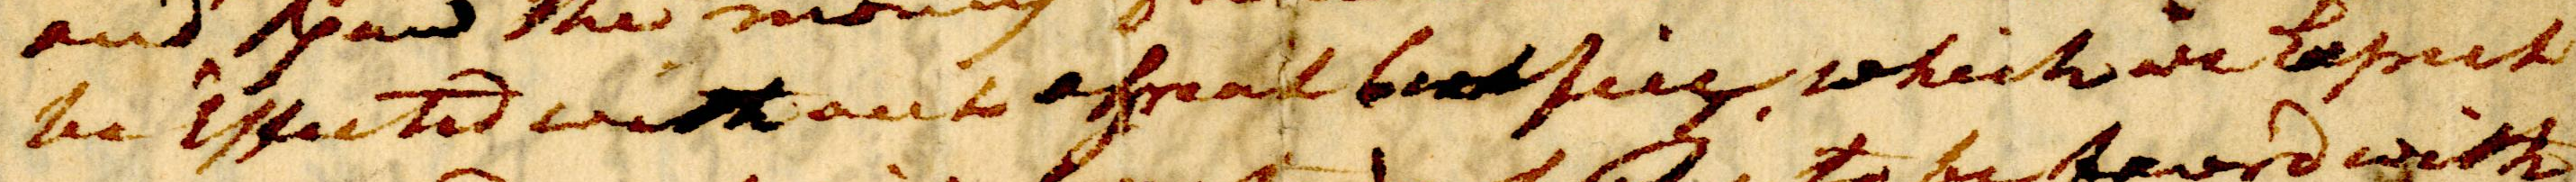be expected without a great cost being which we expect
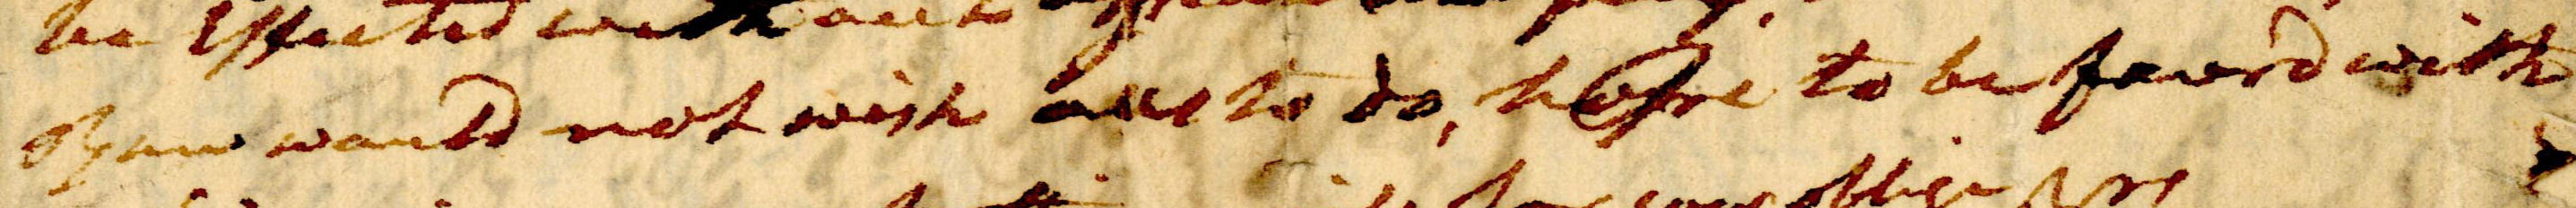you would not wish also to do, haste to be fav^rd with
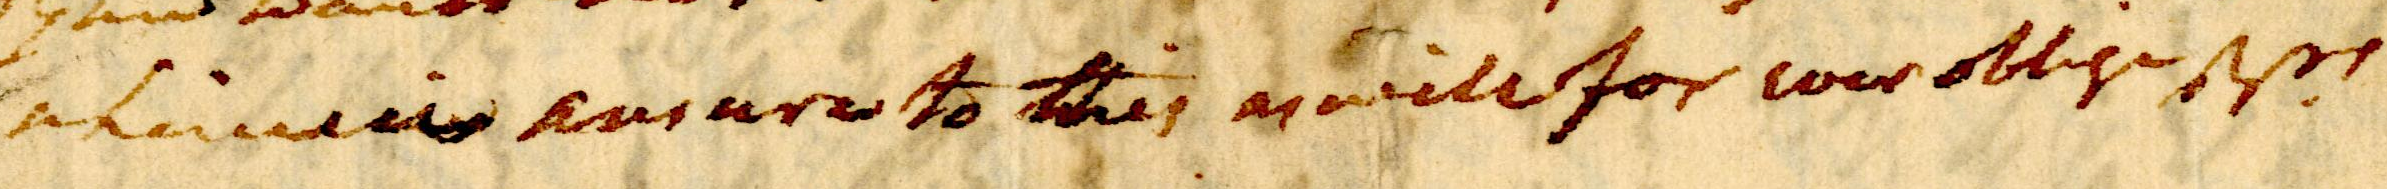a line [___] ansure to this as will forever oblige Y^rs.
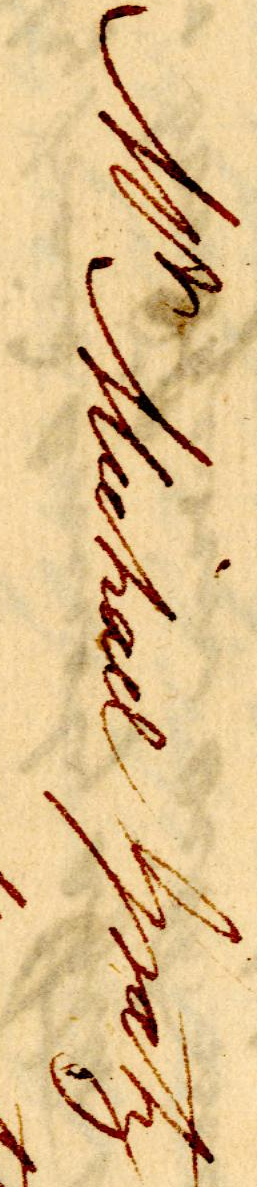M^r Michael Gratz
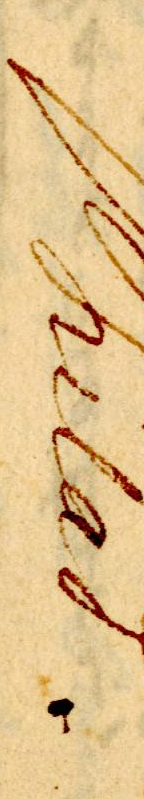Philad^a
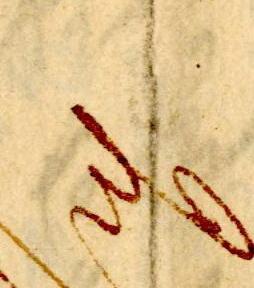In
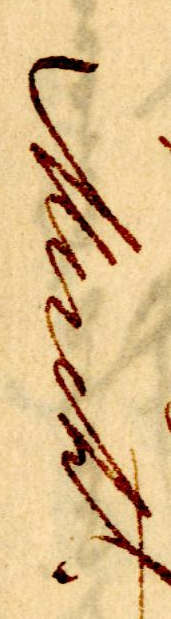Merch^t
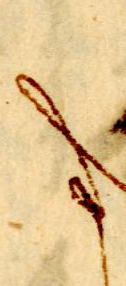To
